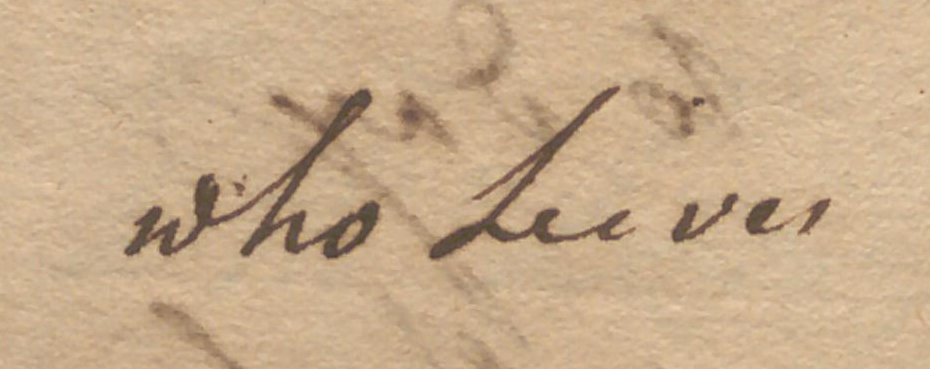who Leives
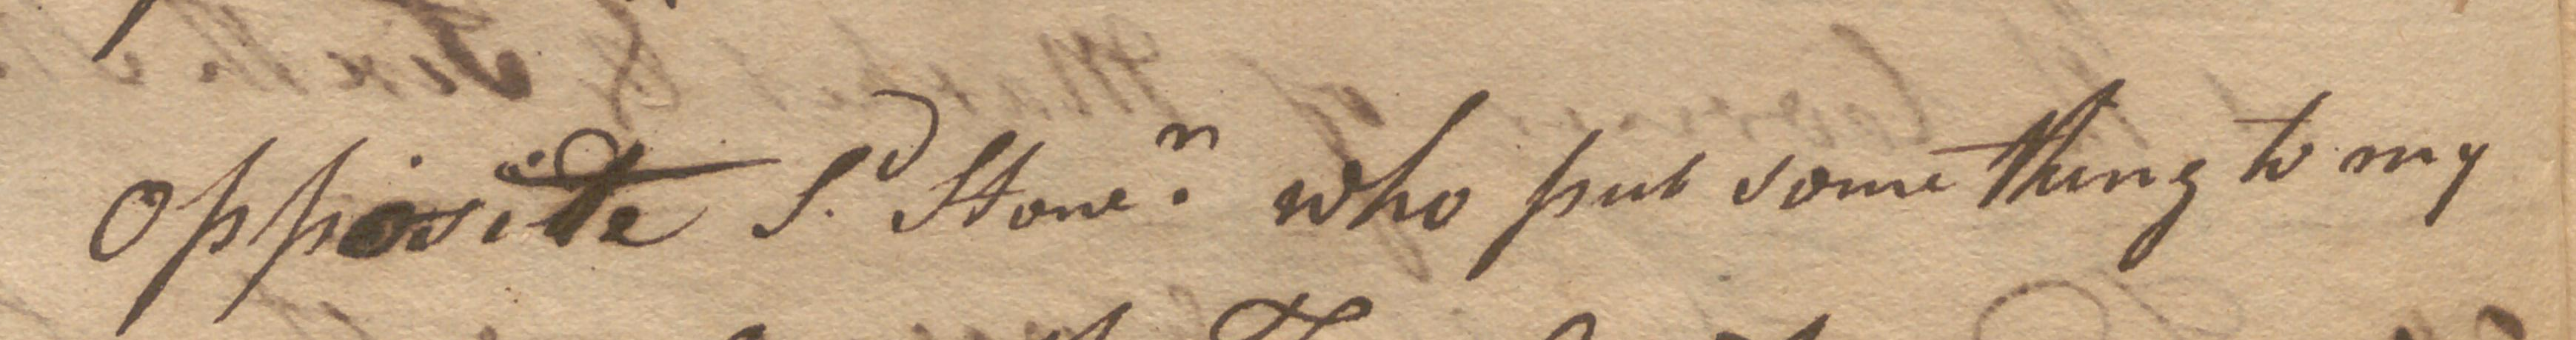opposite s^d. Stone^r. who put some thing to my
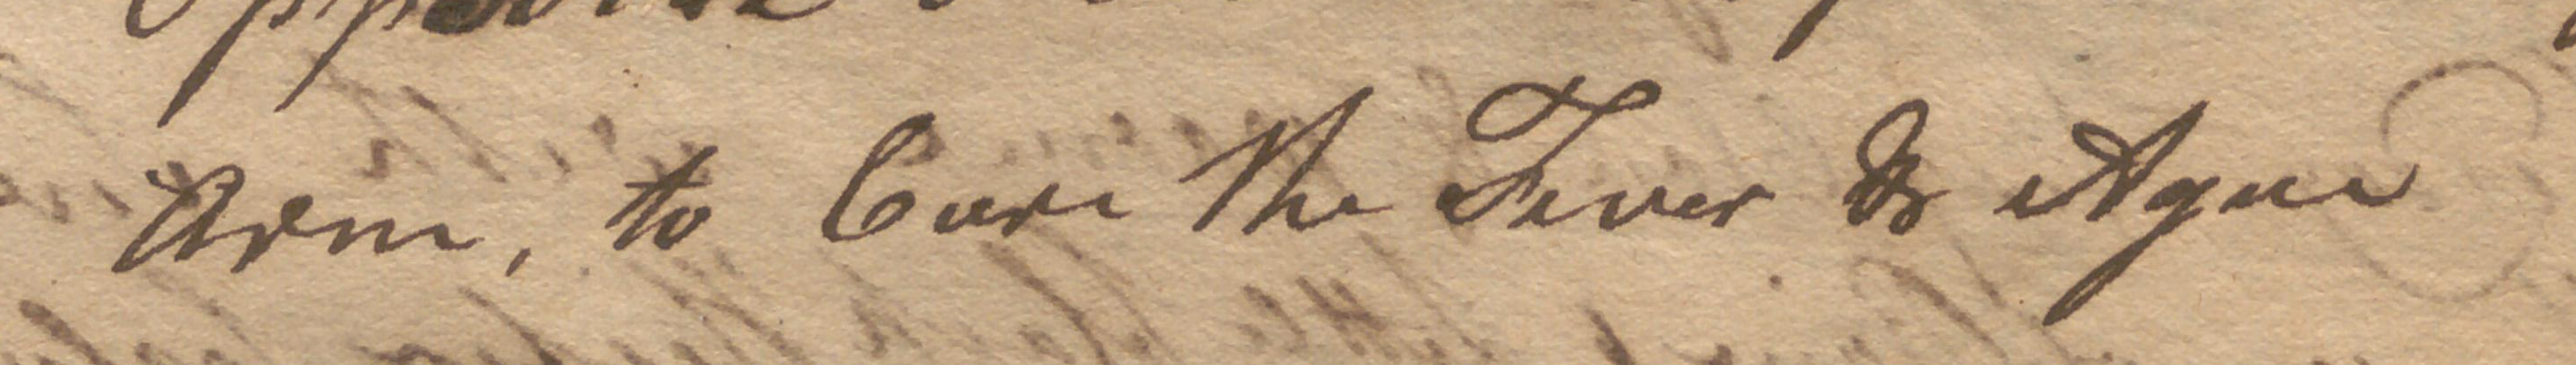Arm, to Cure the Fever & Aque
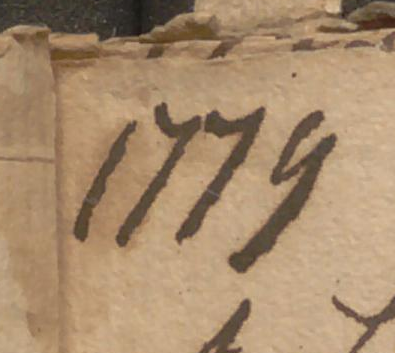1779
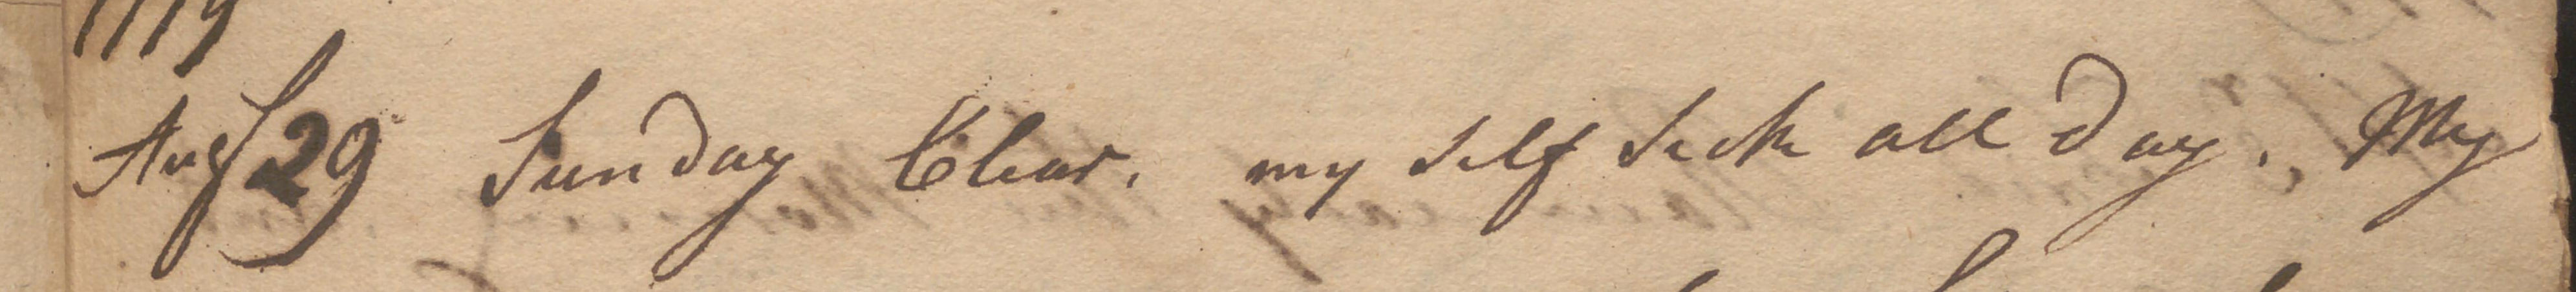Aug^t 29 Sunday Clear, my self sick all day. My
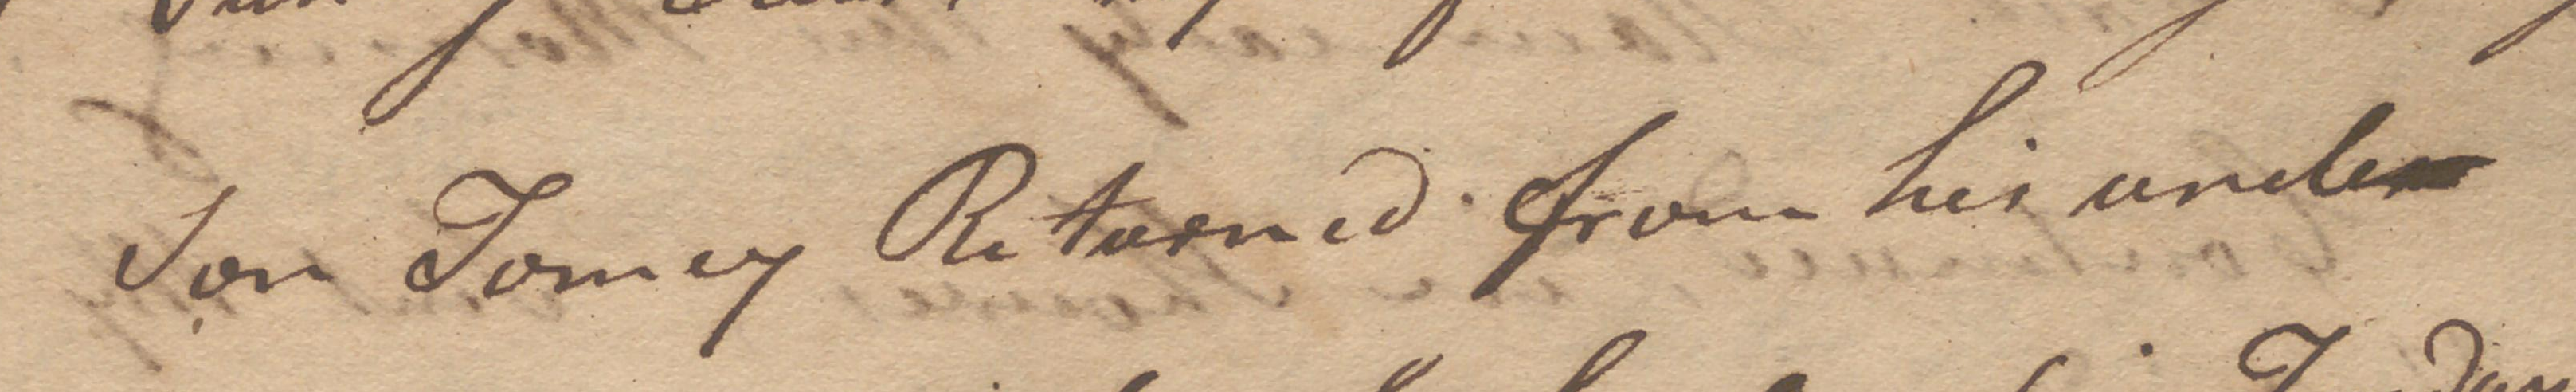Son Tomey Returned from his uncle
